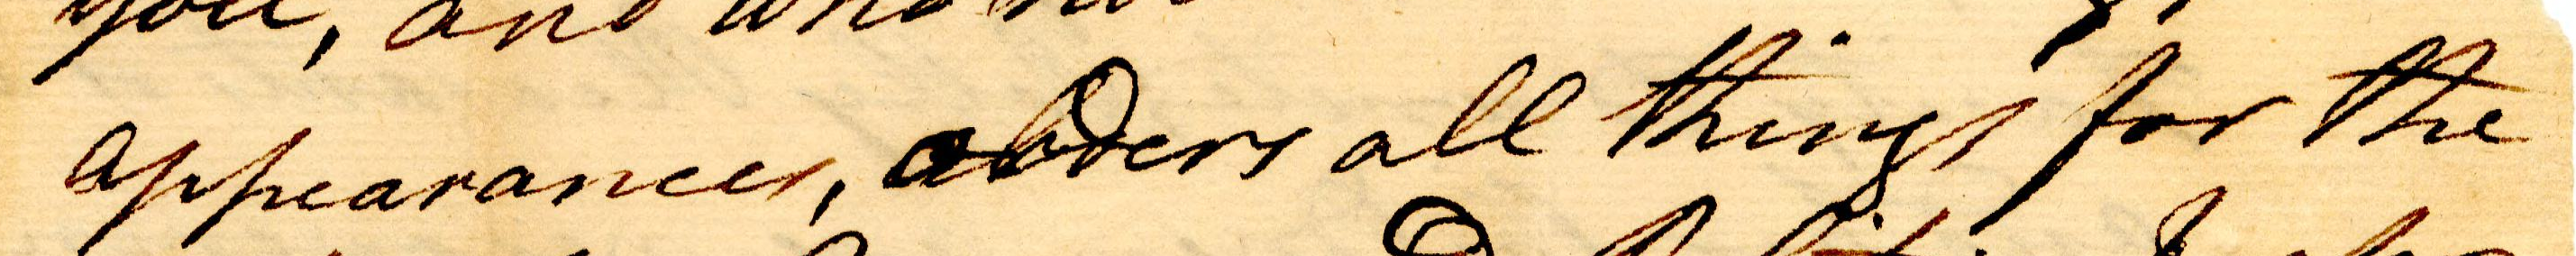appearances, orders all things for the
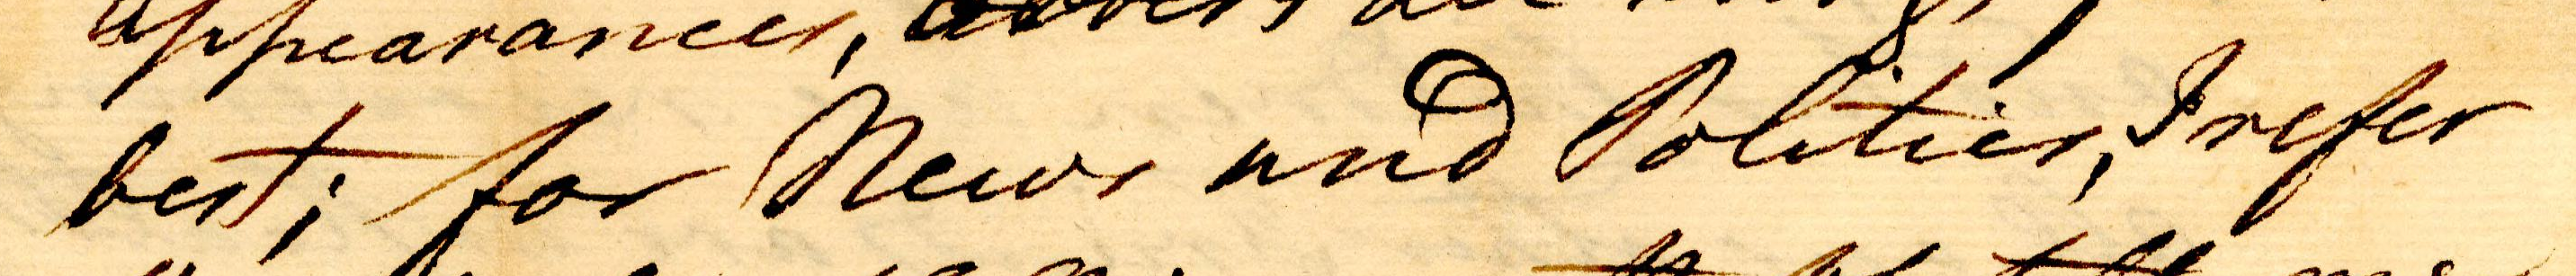best; for News and Politics, I refer
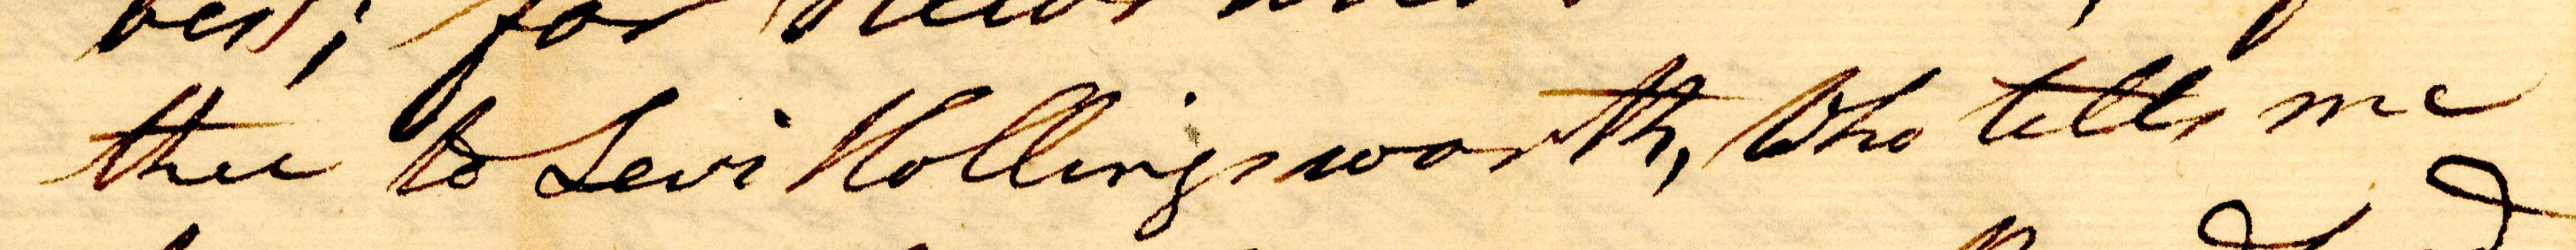thee to Levi Hollingsworth, who tells me
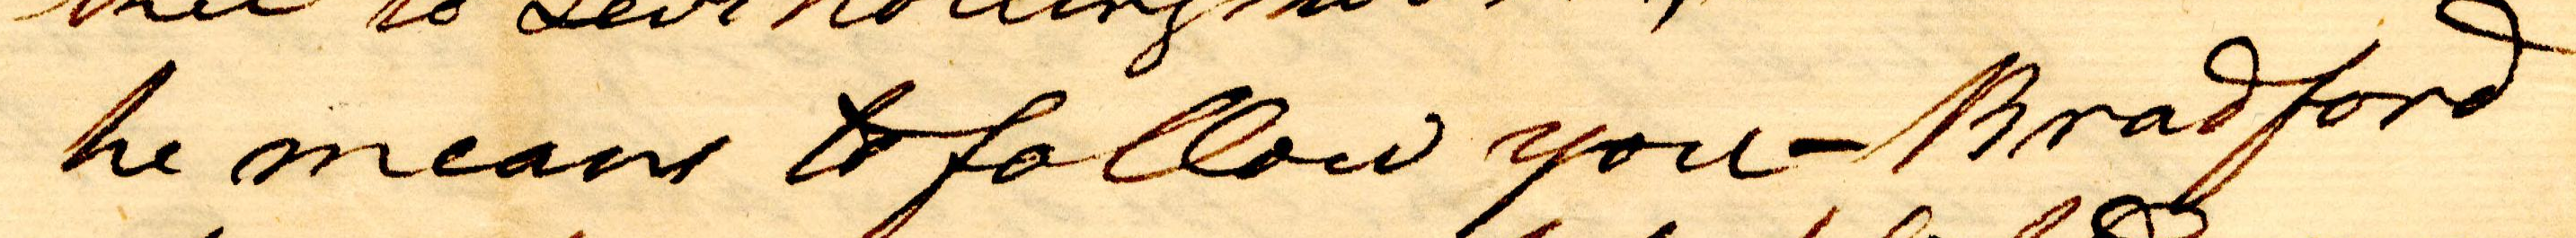he means to follow you- Bradford
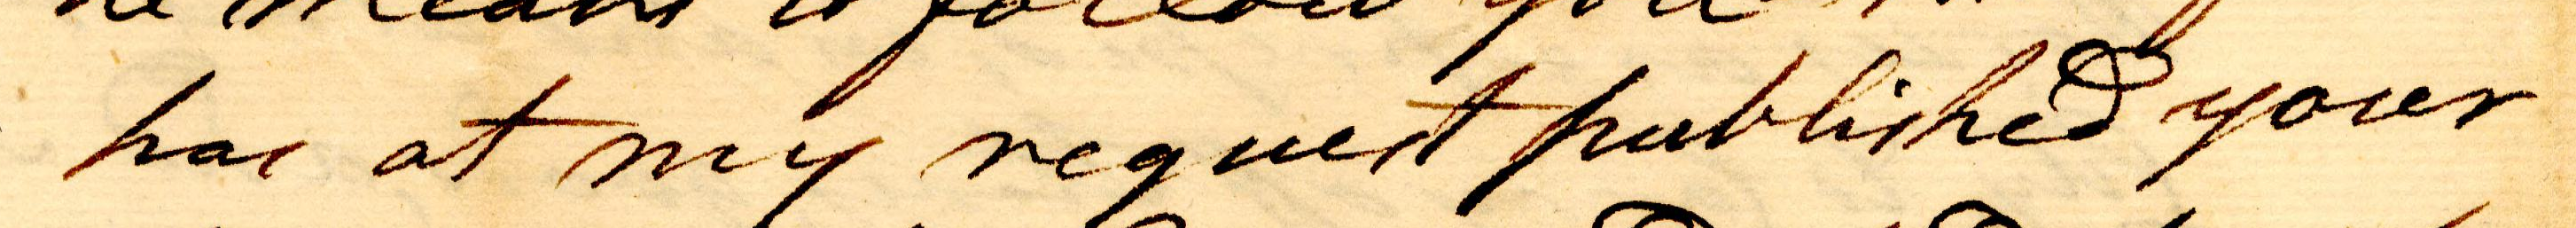has at my request published your
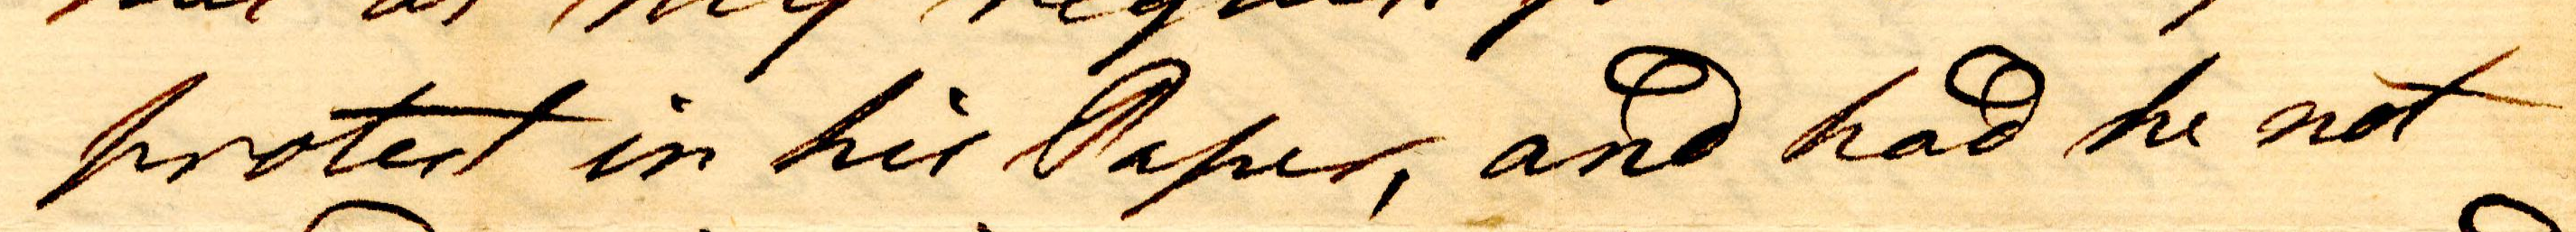protest in his Paper, and had he not
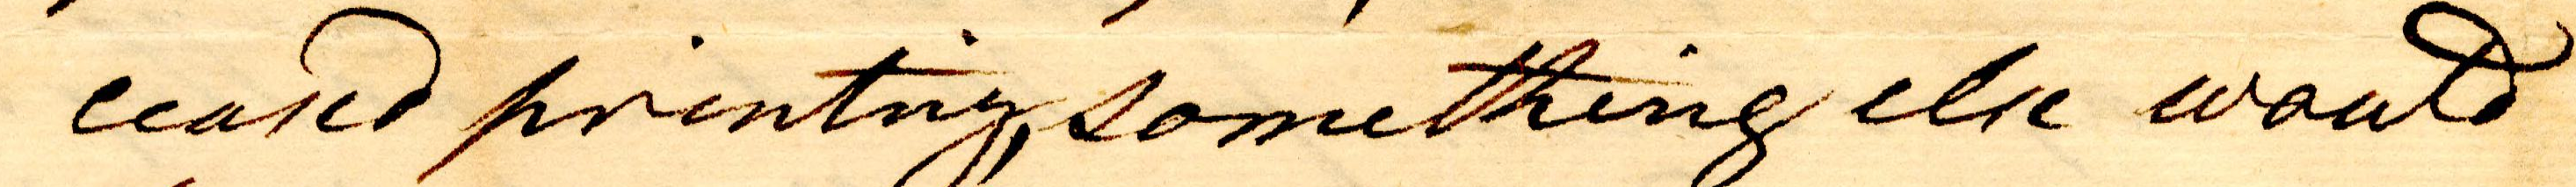ceased printing, something else would
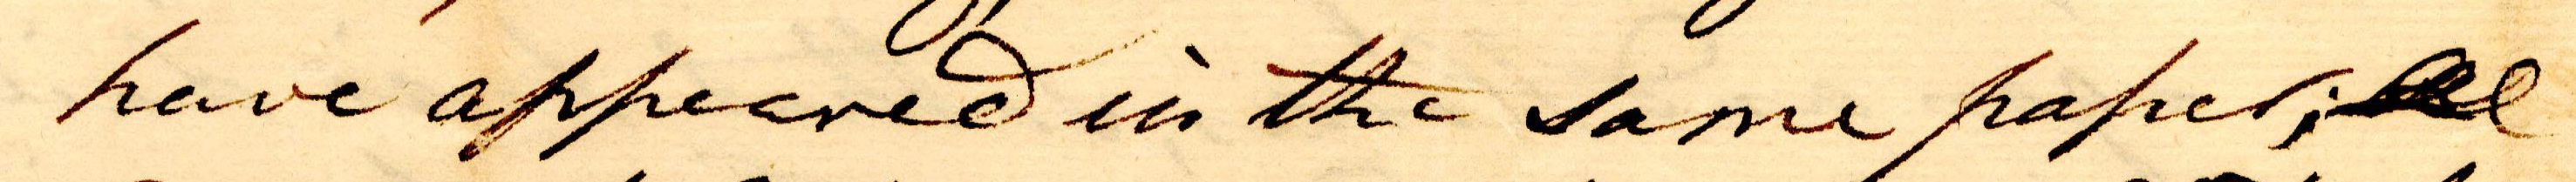have appeared in the same paper; [___]
